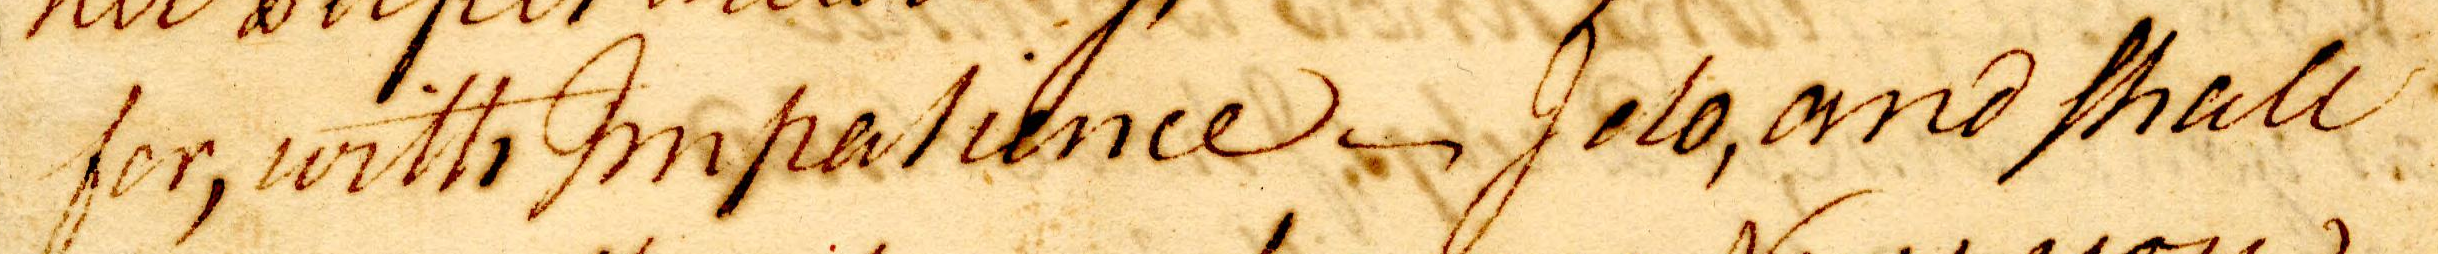for, with Impatience- I alo, and shall
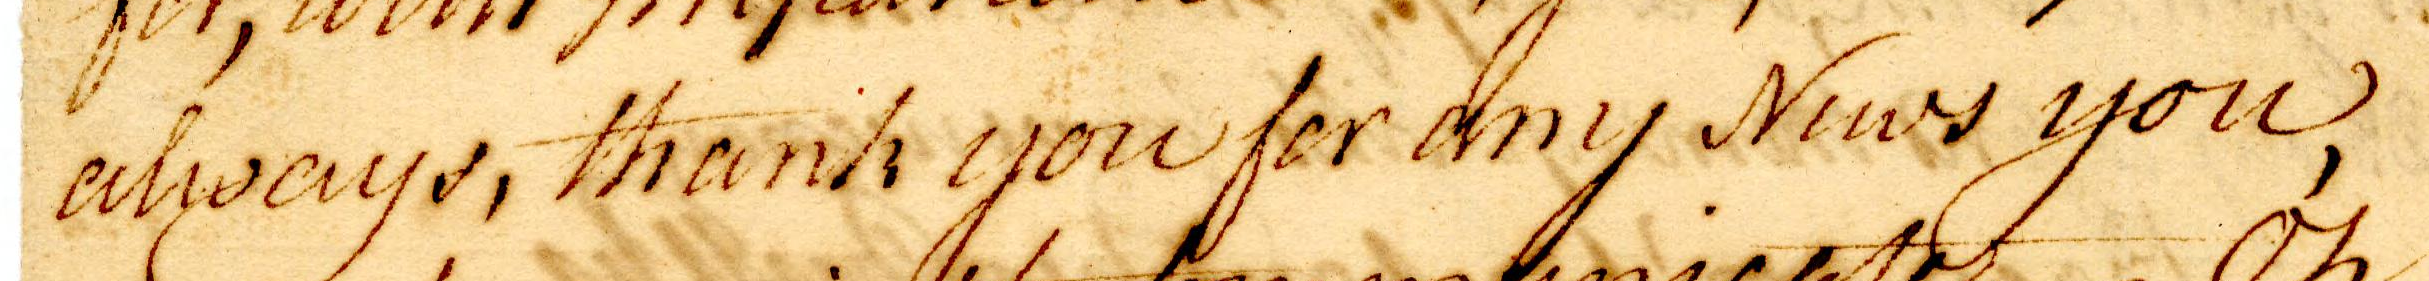always, thank you for any News you,
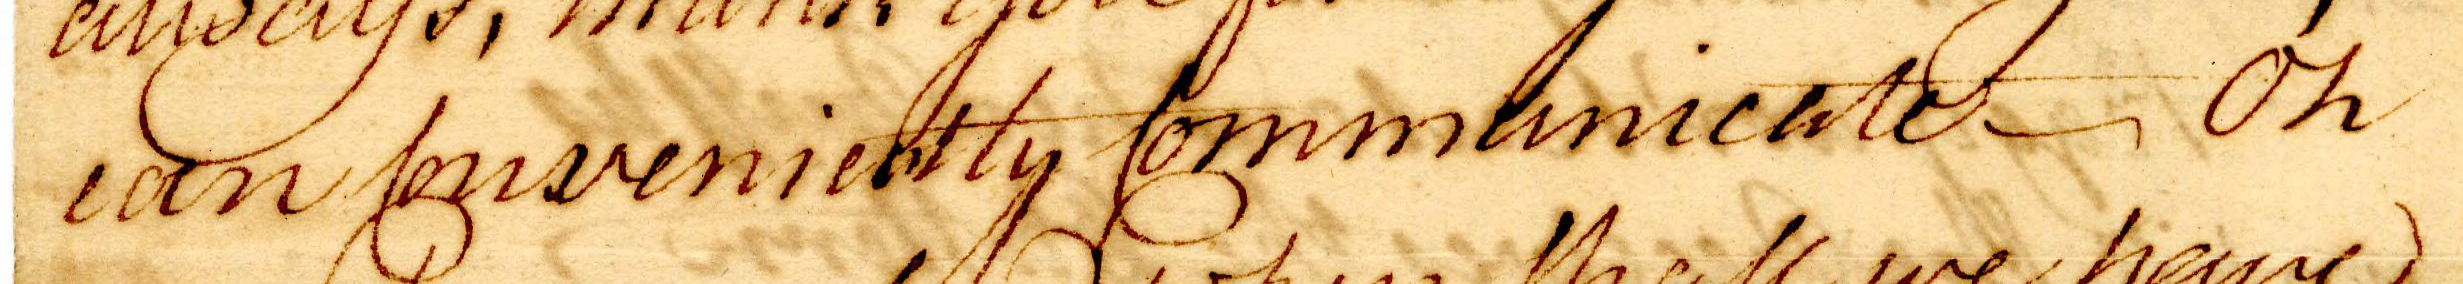can conveniently Communicate- Oh
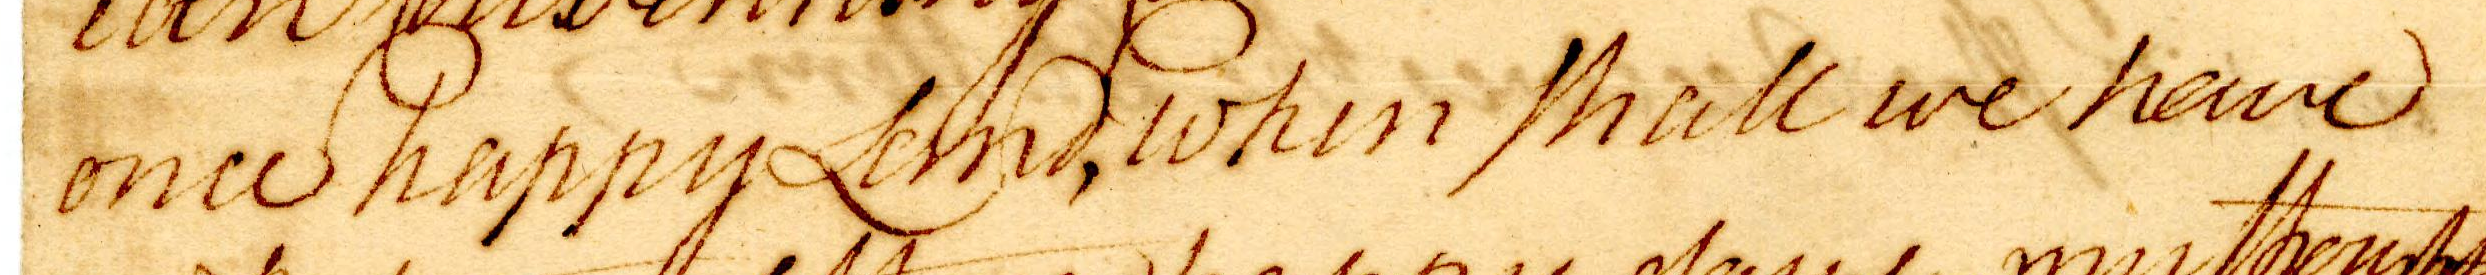once happy Land, when shall we have
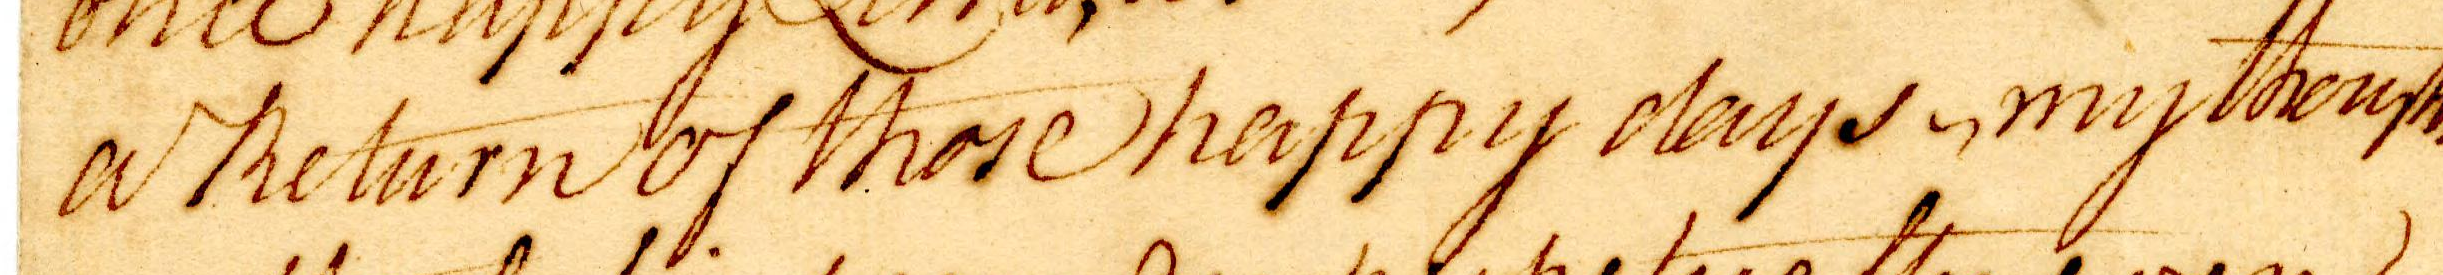a Return of those happy days, my thoughts
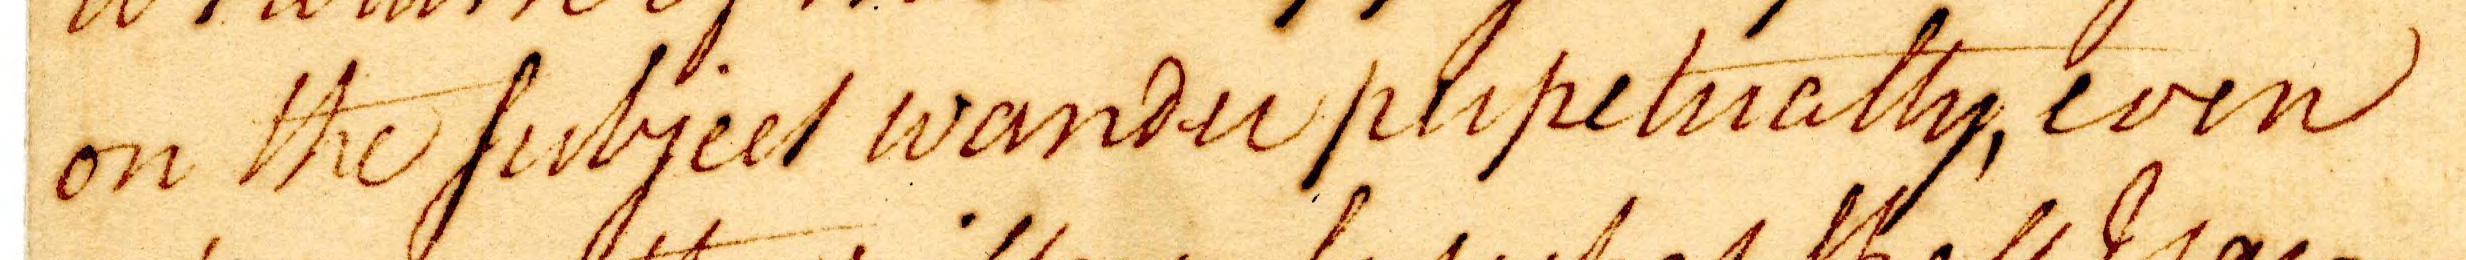on the subject wander perpetually, even
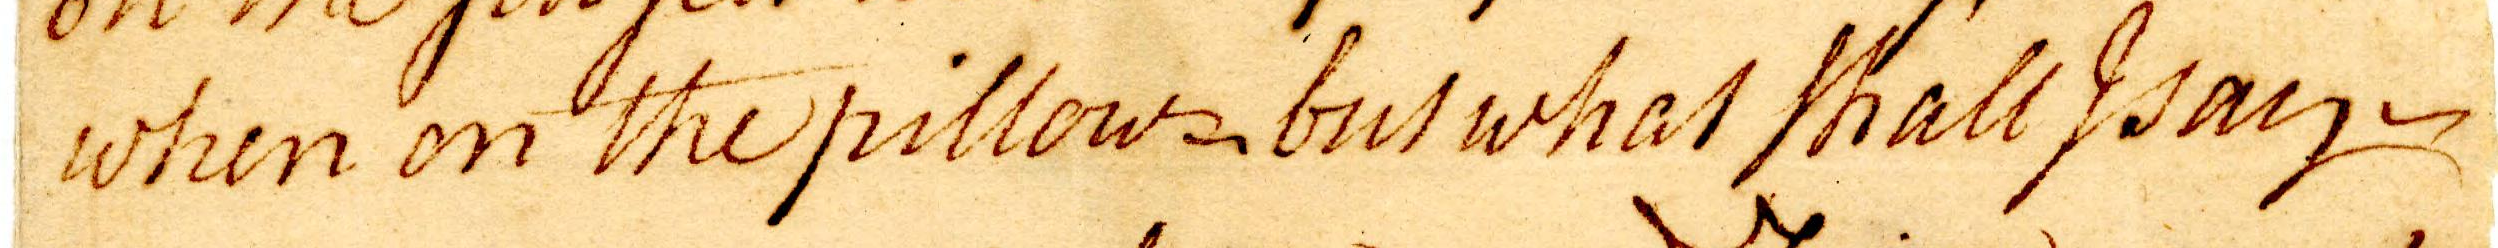when on the pillow, but what shall I say,
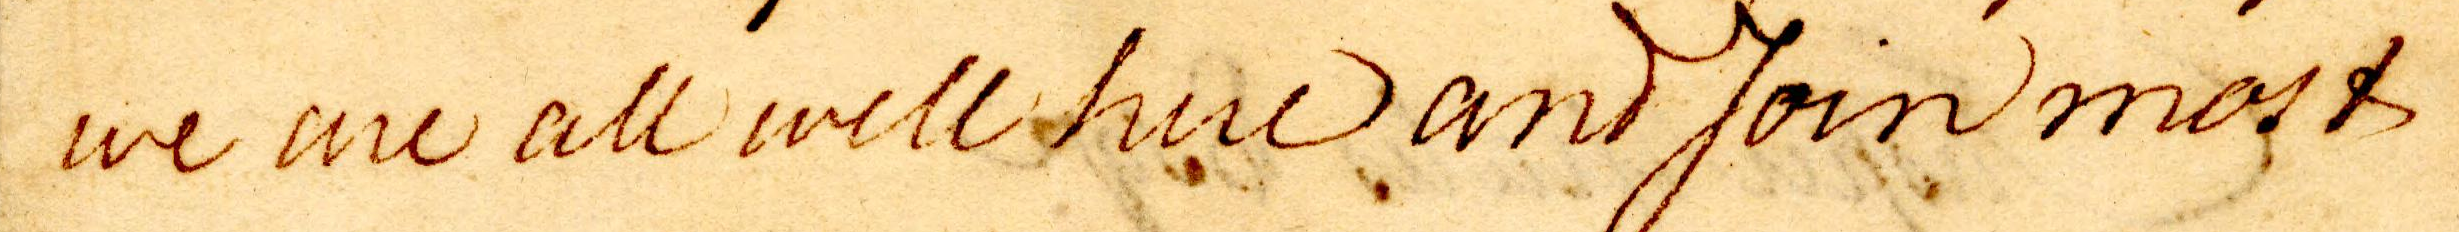we are all well here and join most
